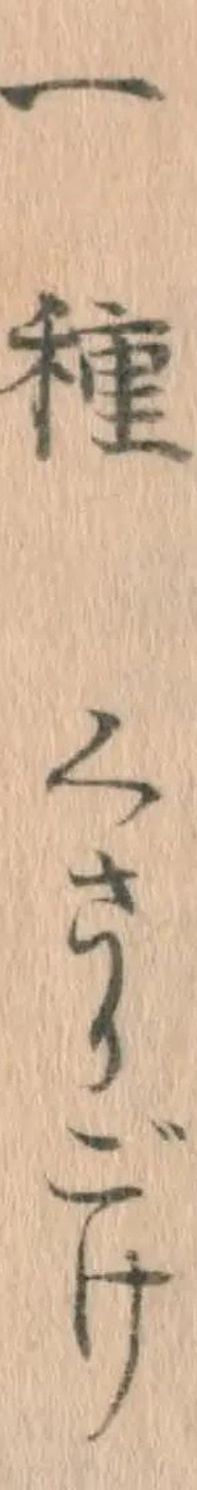一種くさりごけ
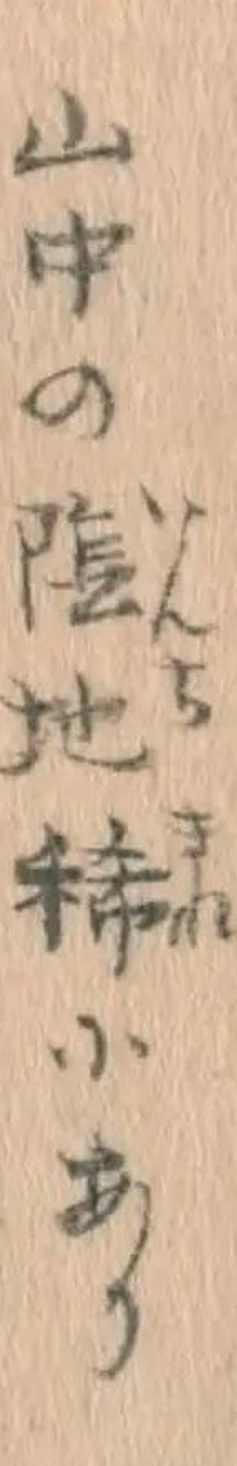山中の陰地稀にあり
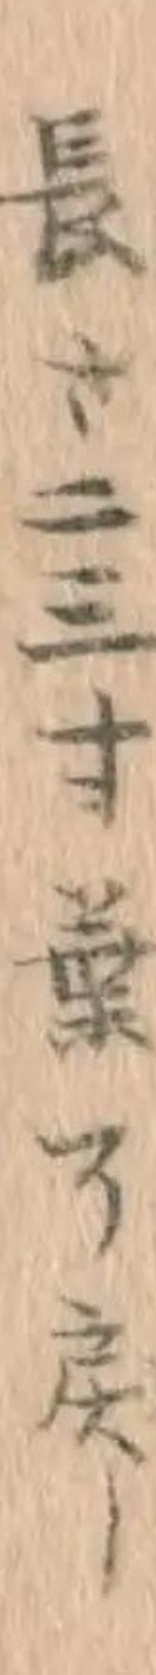長さ二三寸葉了戻し
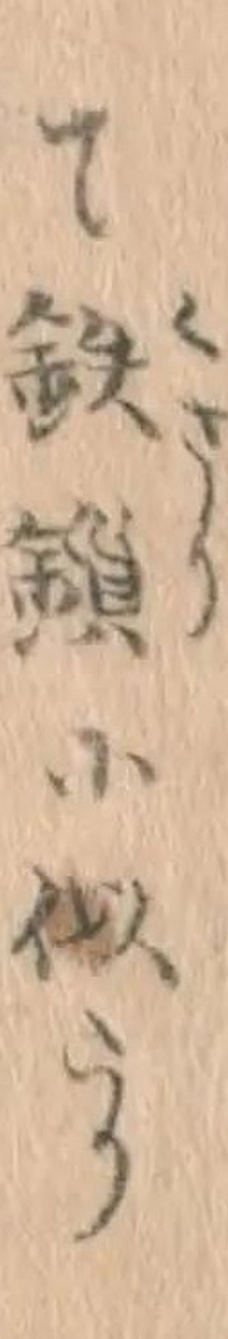て鉄鎖に似たり
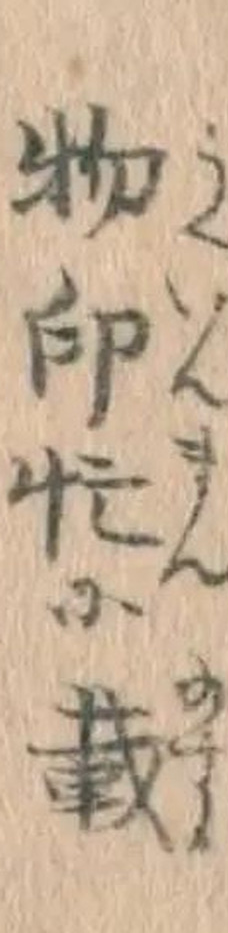物印忙に載
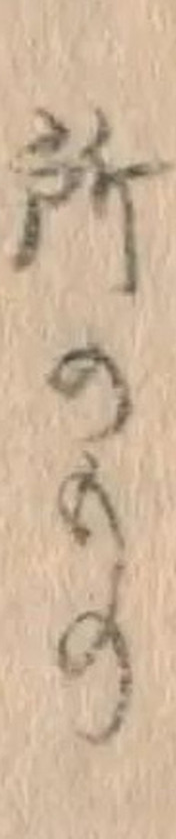所のもの

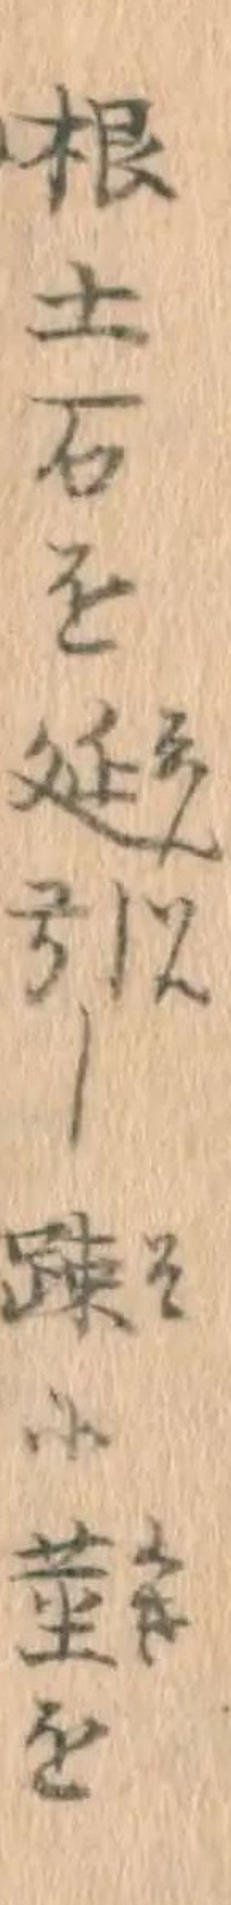根土石を延引し疎に茎を
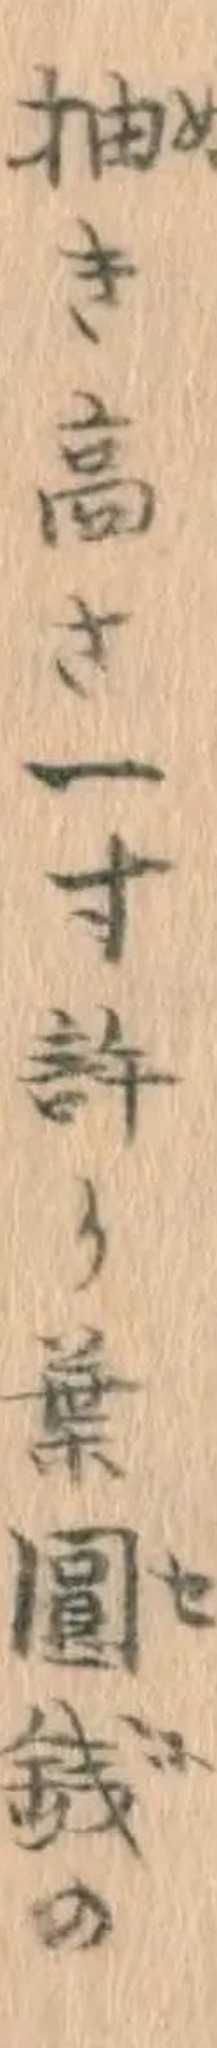抽き高さ一寸許り葉円銭の
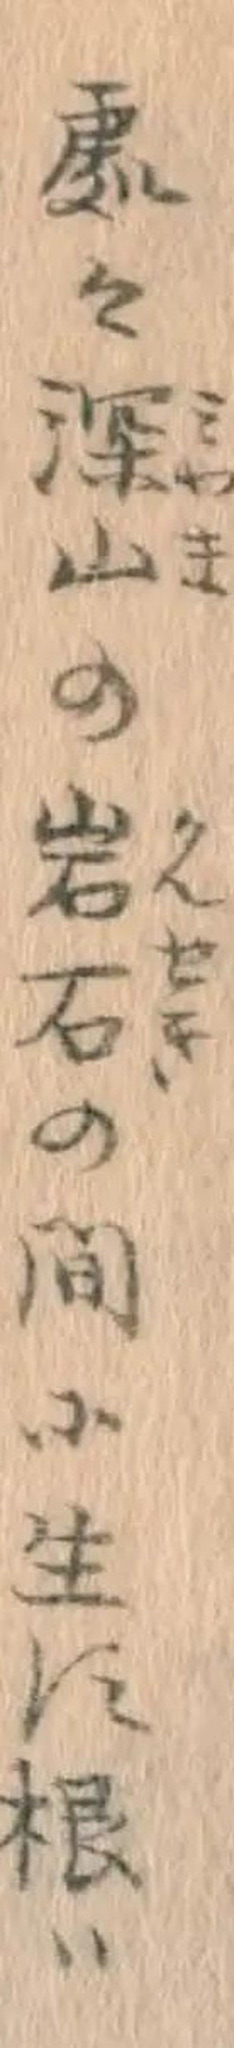処々深山の岩石の間に生す根は
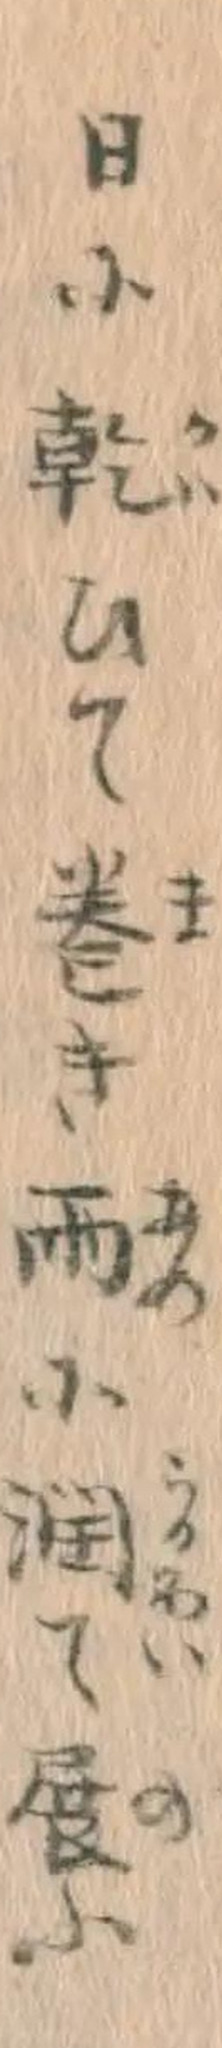日に乾ひて巻き雨に潤て展ふ

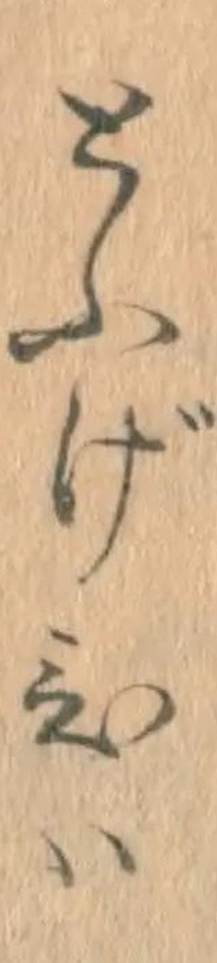とふげひは
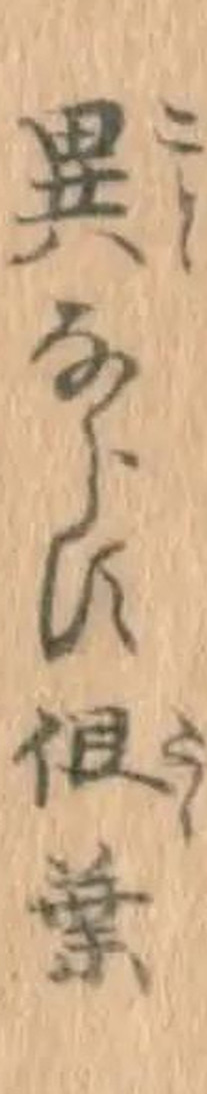異ならす但葉
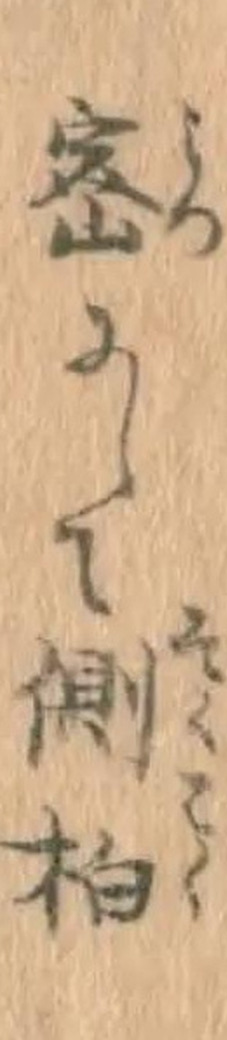密にして側柏
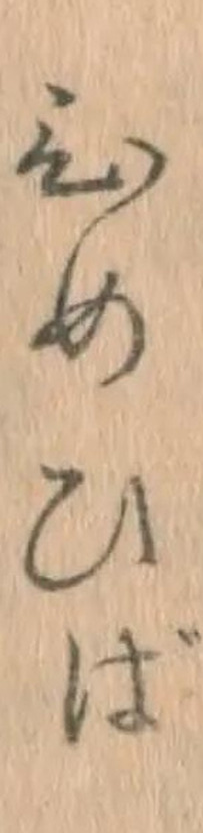ひめひば
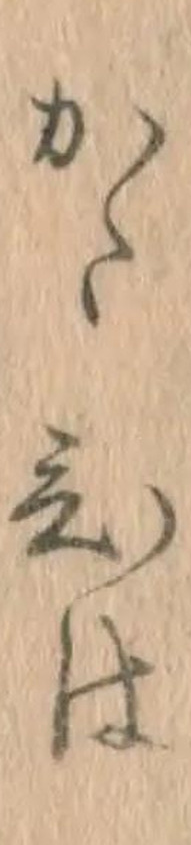かたひは
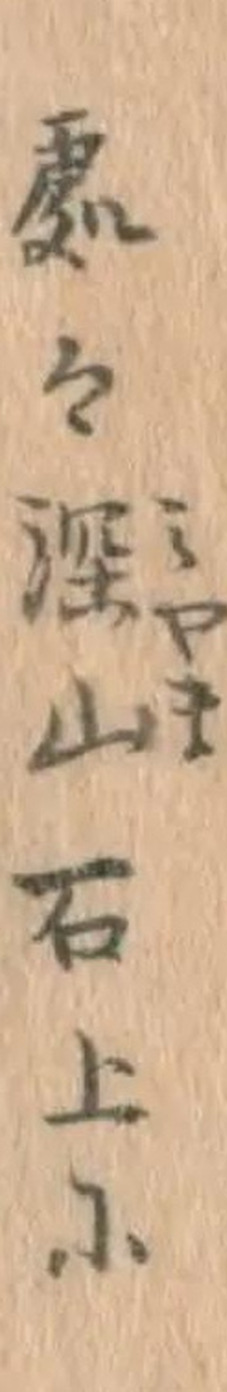処々深山石上に
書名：本草図譜. 巻37-39
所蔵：国立国会図書館 National Diet Library, JAPAN
